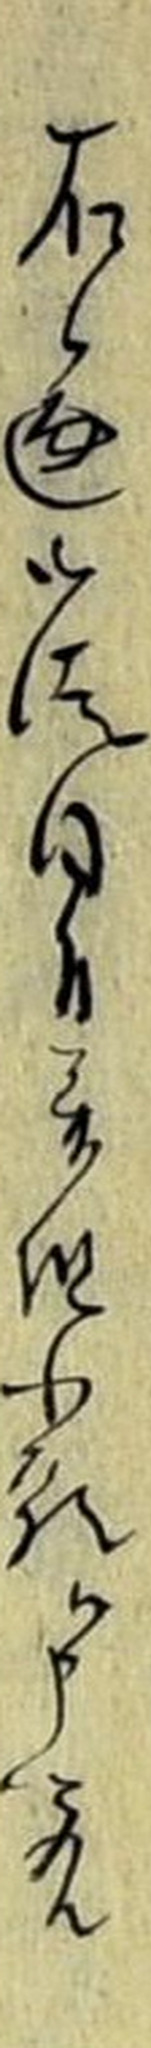右之通御徒目付并組小頭江申聞ル
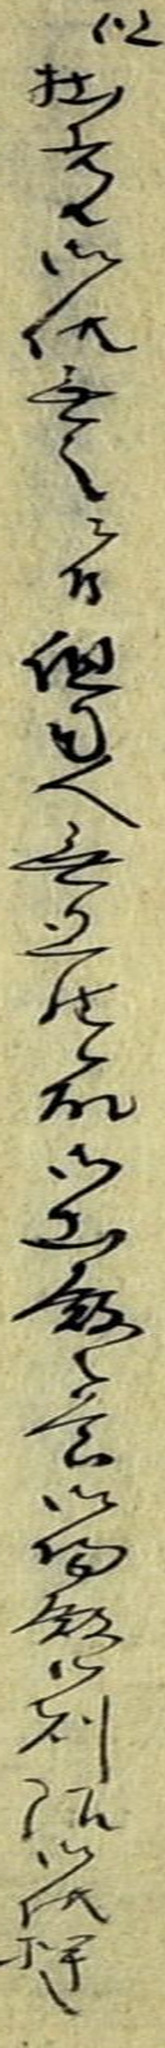但拙者共御共無之に付側用人無御座候故御出殿之節御帰殿は則様御供押之
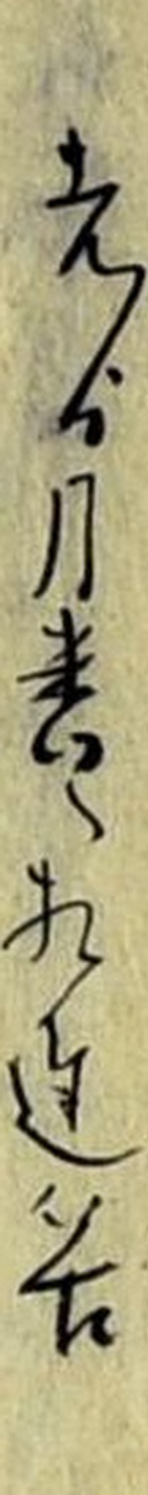者ゟ月番へ相達筈
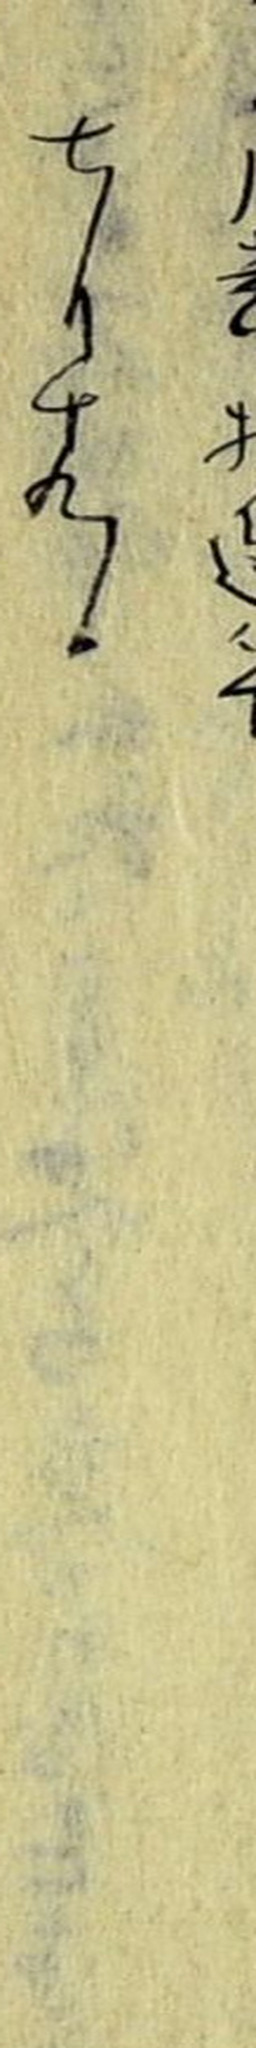七月十九日
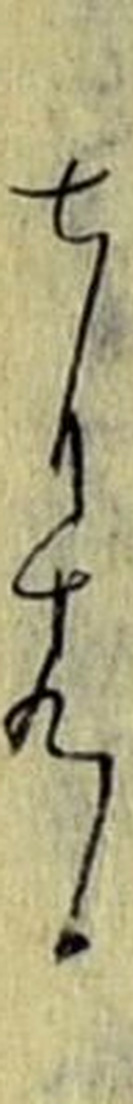七月十九日
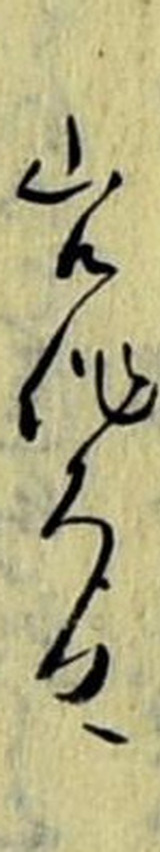山口作右衛門へ

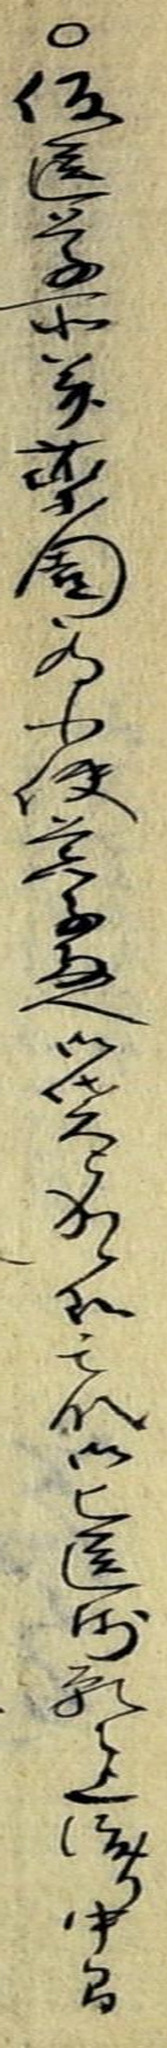○仮医学所并薬園為小使荒子両人御貸被成候処其段御匕医師願之上渡り中間
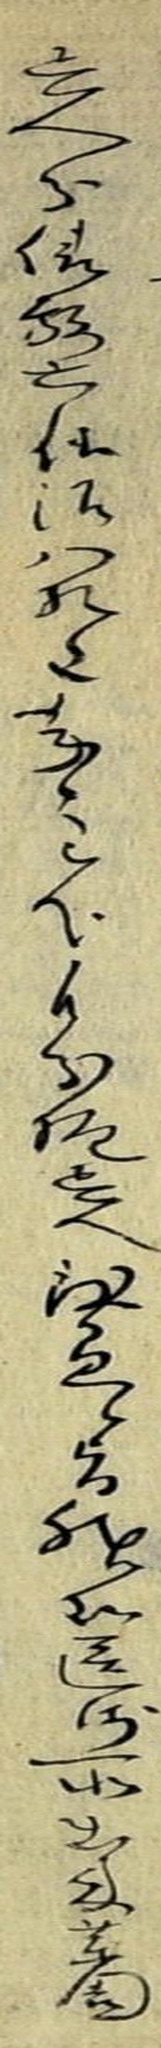壱人分俵数六俵銀八拾匁年々被下自分抱壱人致置候旨然ル処医師所出来薬園
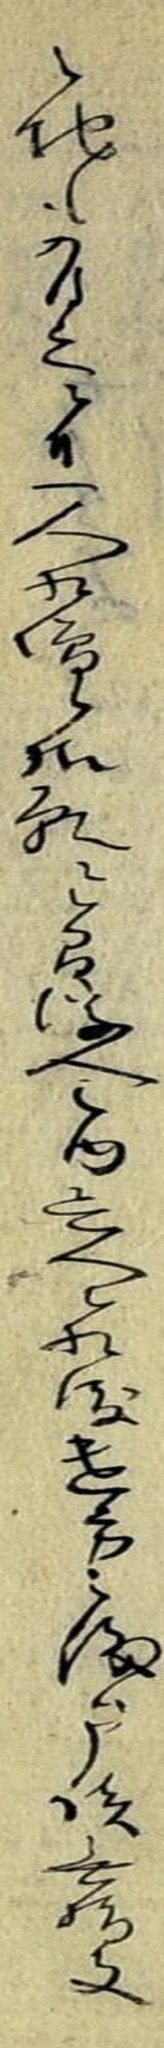之地も有之に付一人相増候様願に候間浮人之内壱人被相渡遣方之儀は申談無指支
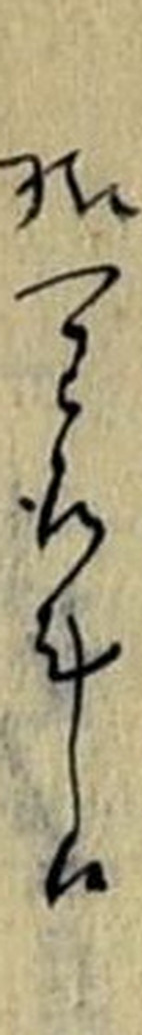様可被取斗候
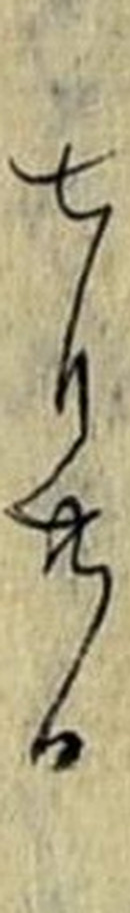七月廿日
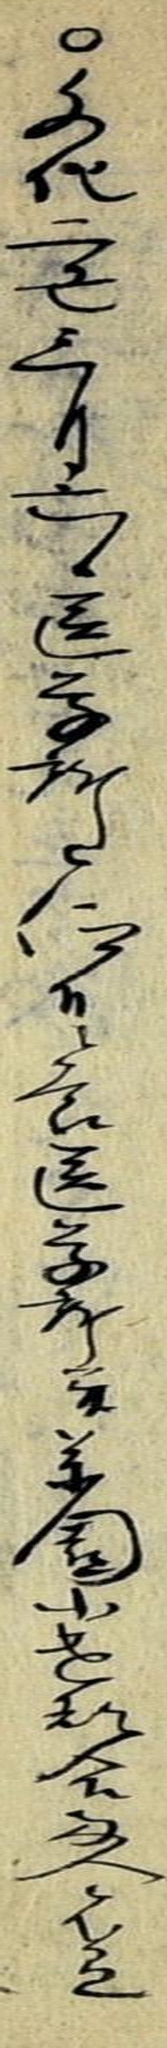○文化二丑三月六日医学所被仰付候節医学所并薬園小遣都合両人被下置
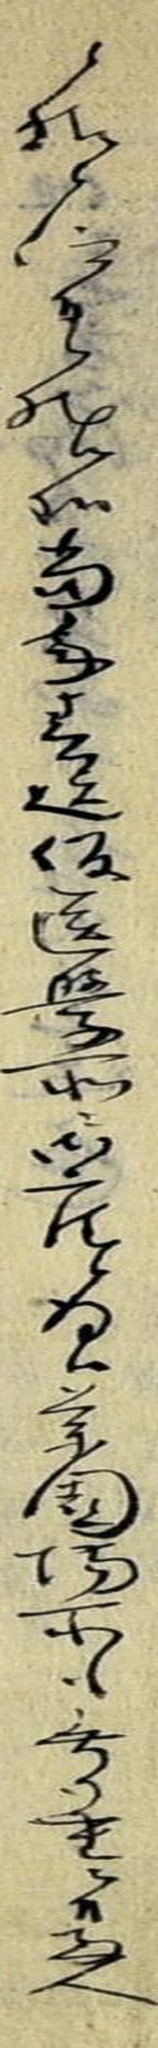候様被仰付候然ル処当年是迄仮医学所に御座候得は薬園場所も無御座に付両人
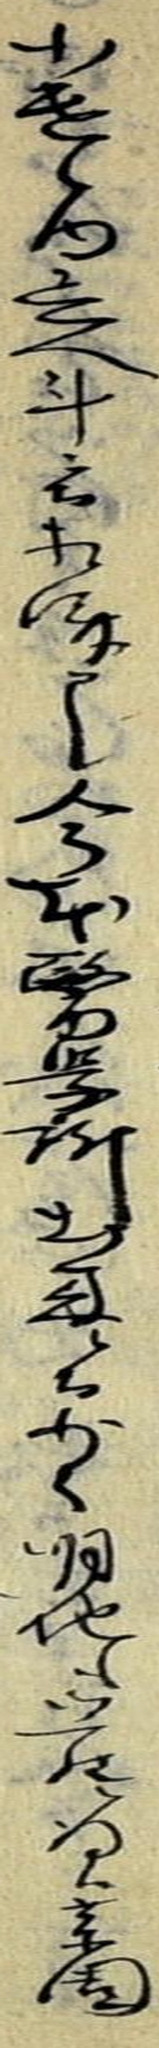小遣之内壱人斗に而相済申候今本医学所出来候而少々明地も御座候得は薬園
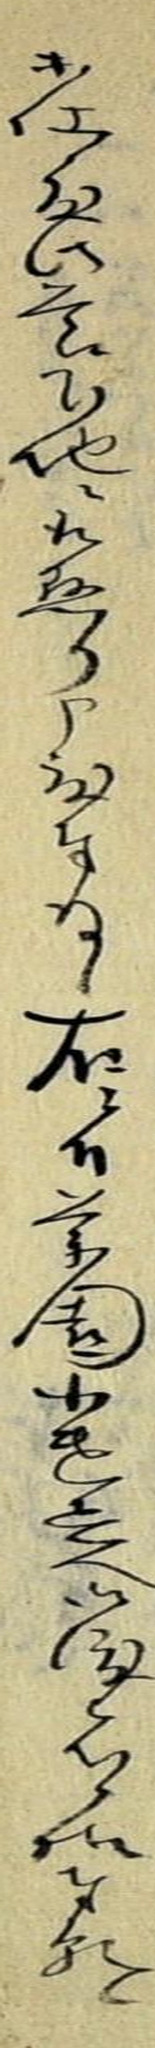等仕度此節下地に取懸り申度奉存候右に付薬園小遣壱人御渡被下候様奉願候
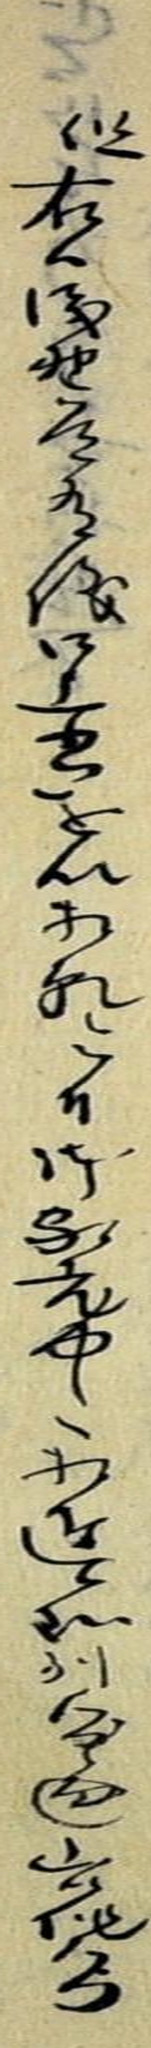但右は浅野道儀口上書を以相願候に付御家老中へ相達候処別紙之通山口作右衛門
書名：命令之部 四
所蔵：福井県文書館 Fukui Prefectural Archives
